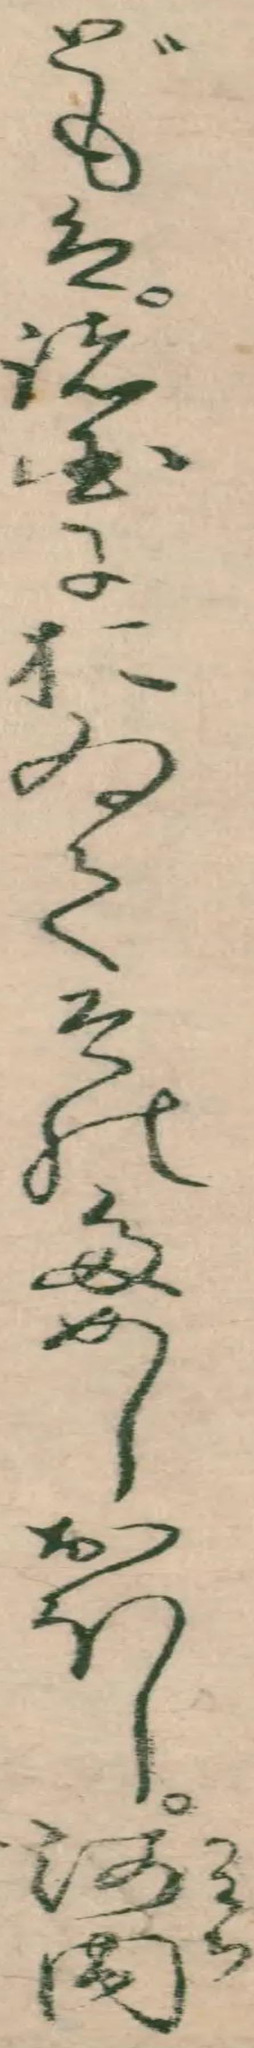どもは。諸国におゐてそのためしおほし。河内
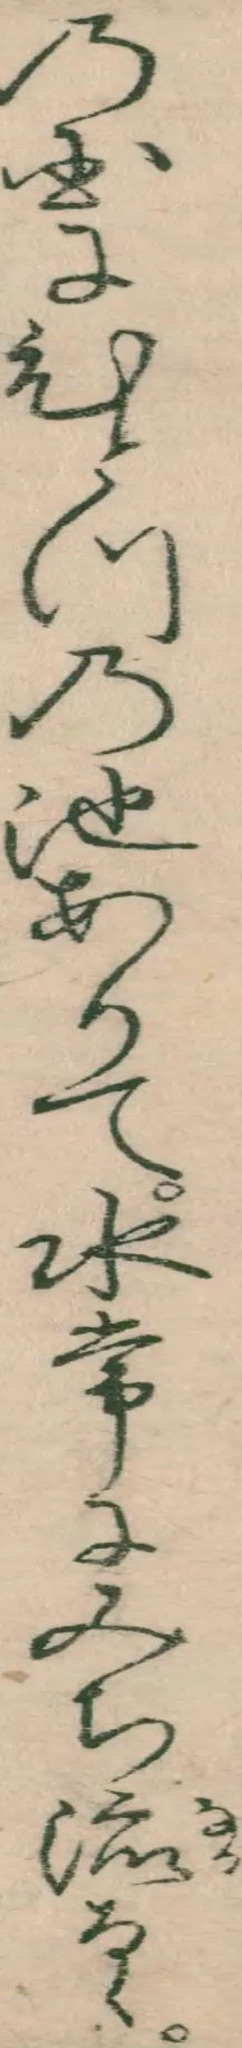の国にひとつの池ありて。水常にみち流るゝ。
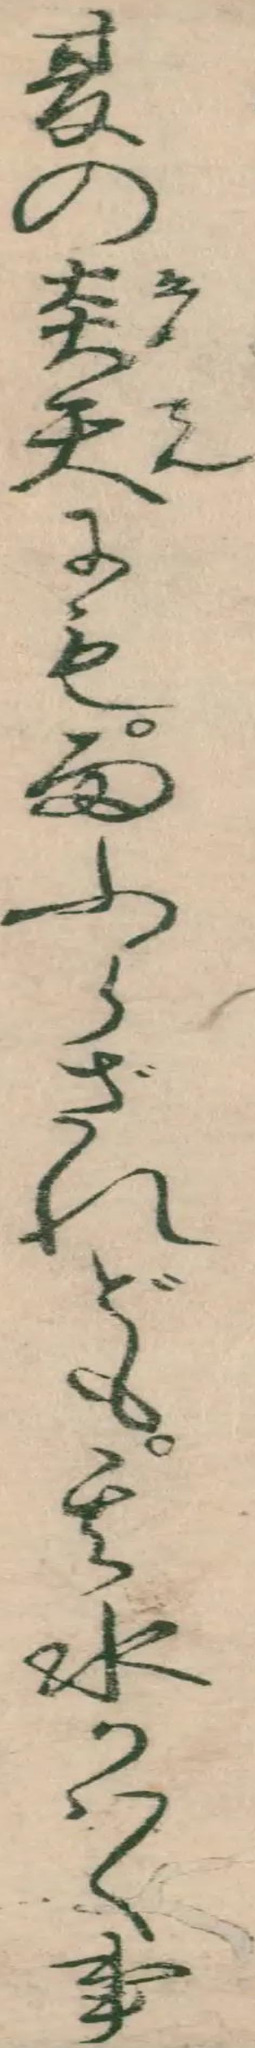夏の炎天にも。雨ふらざれども。其水かはく事
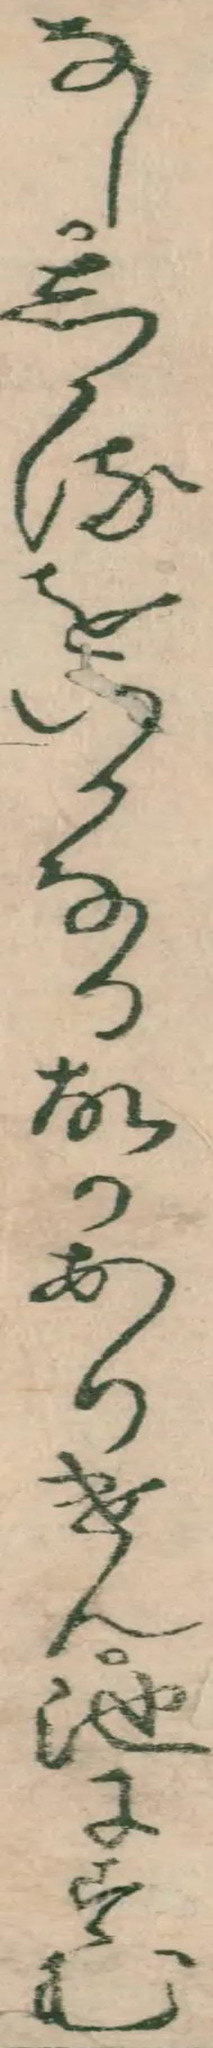なし。しかるをいかなる故かありけん。池にすむ
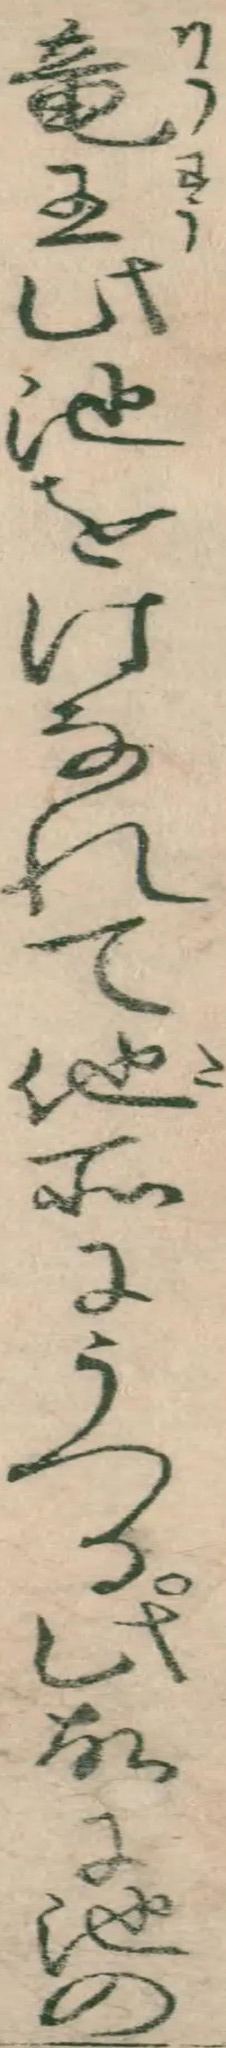竜王此池をはなれて他所にうつる。此故に池の
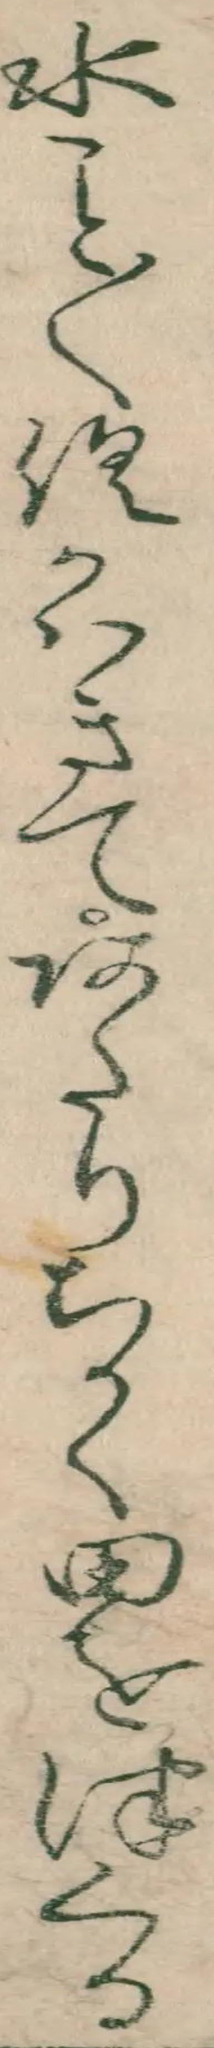水こと〳〵くかはきて。あたりちかく田をつくる
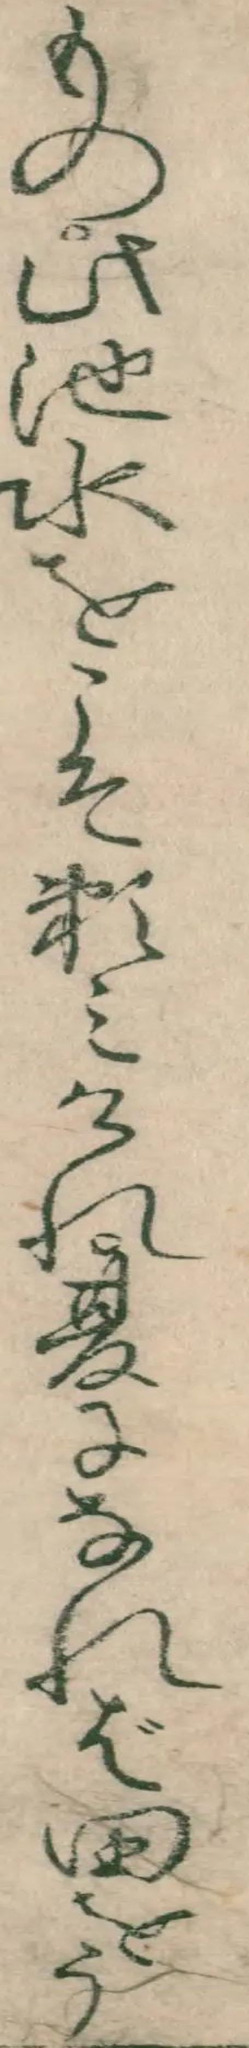もの。此池水をこそ頼みけれ。夏になれば田をう
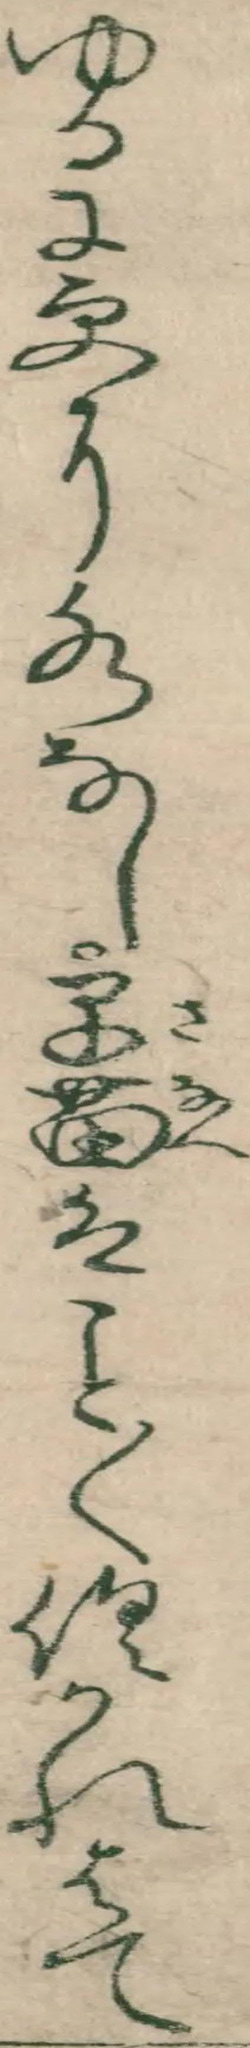ゆるに更に水なし。早苗はこと〳〵くかれはて
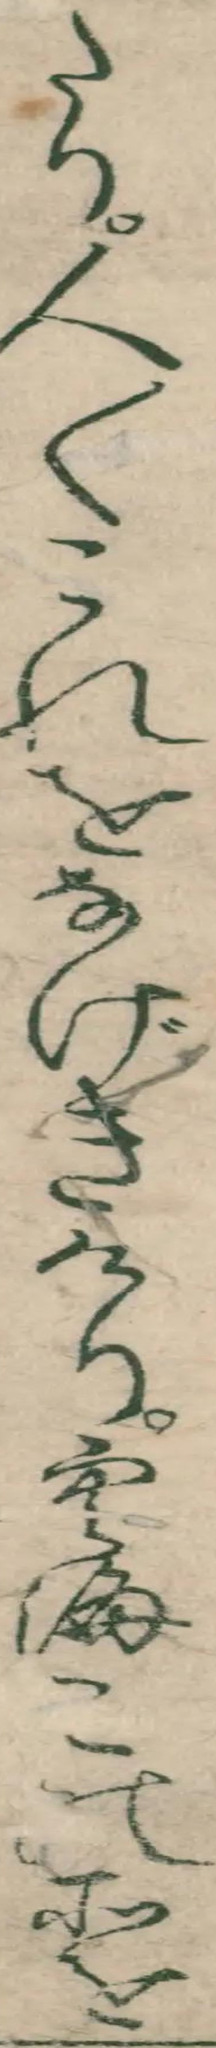たり。人〳〵これをなげきけり。空海この所を

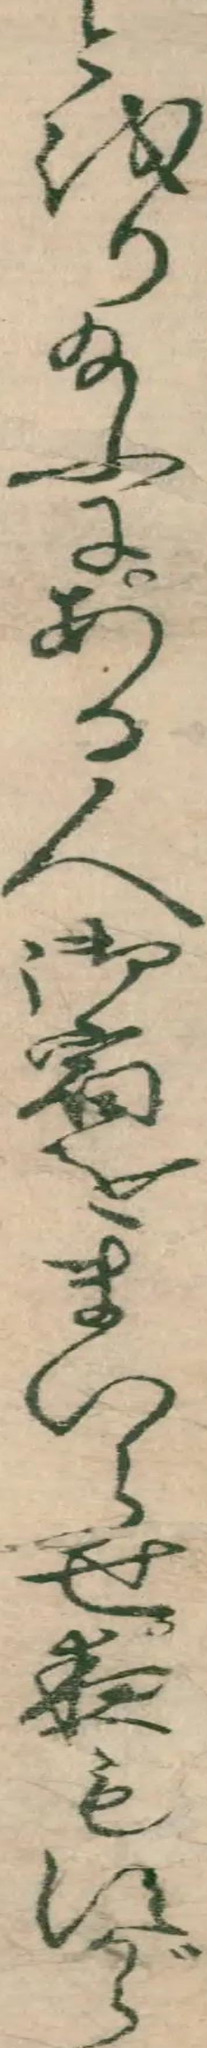とほり給ふに。ある人御宿をまいらせ。夜もすがら
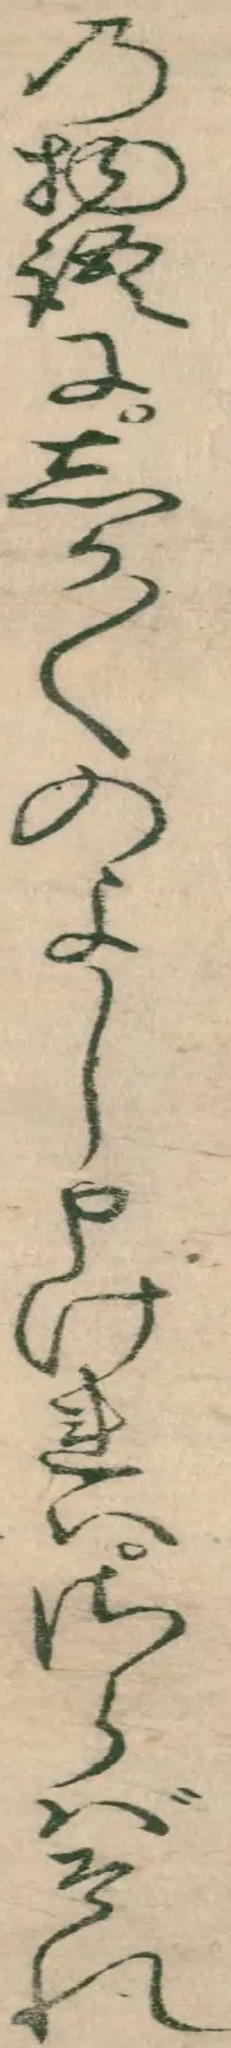の物語に。しか〳〵のよし申けれは。さらばそれ
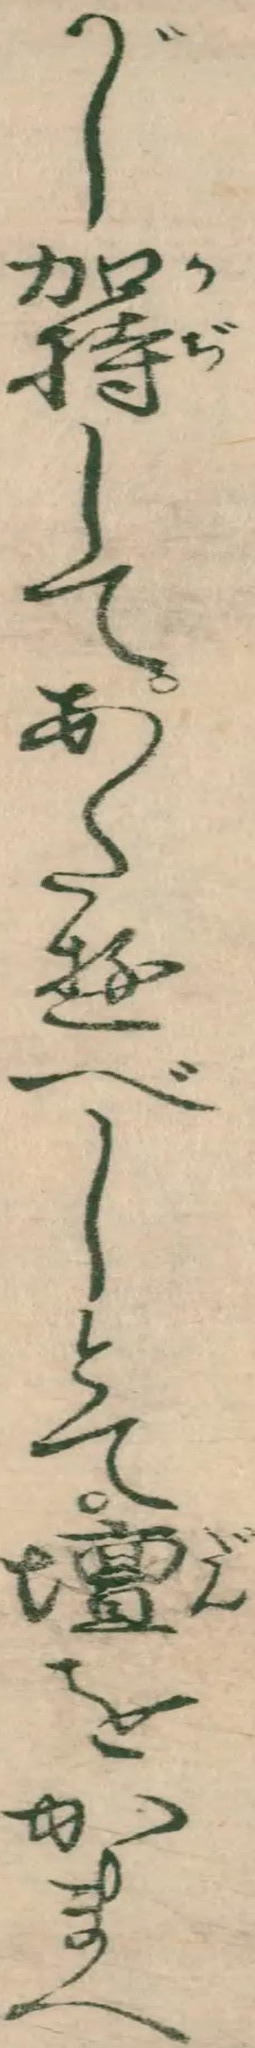がし加持して。あたゆべしとて。壇をかまへ
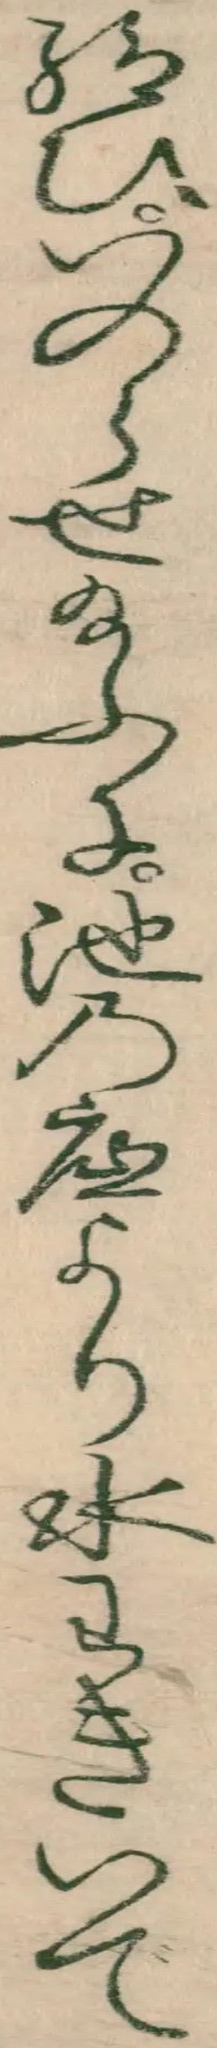給ひ。いのらせ給ふに。池の底より水わきいて
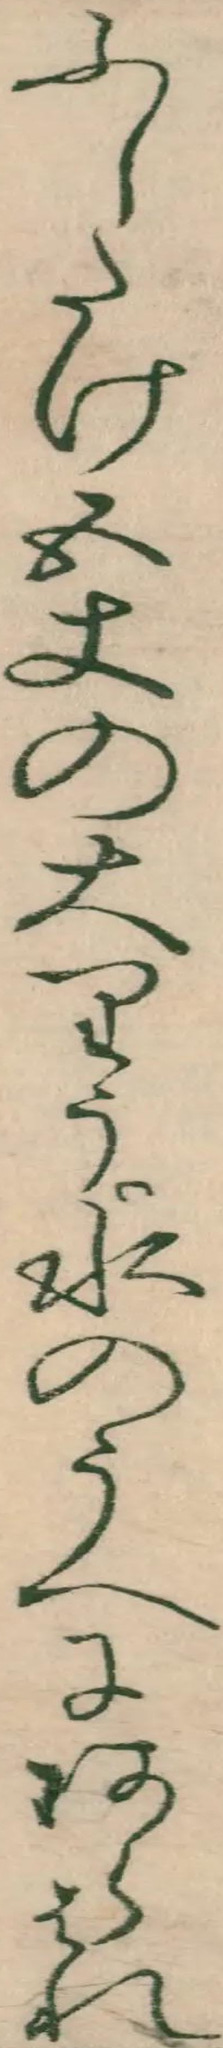ふしたけ五丈の大りう。水のうへにあらはれ
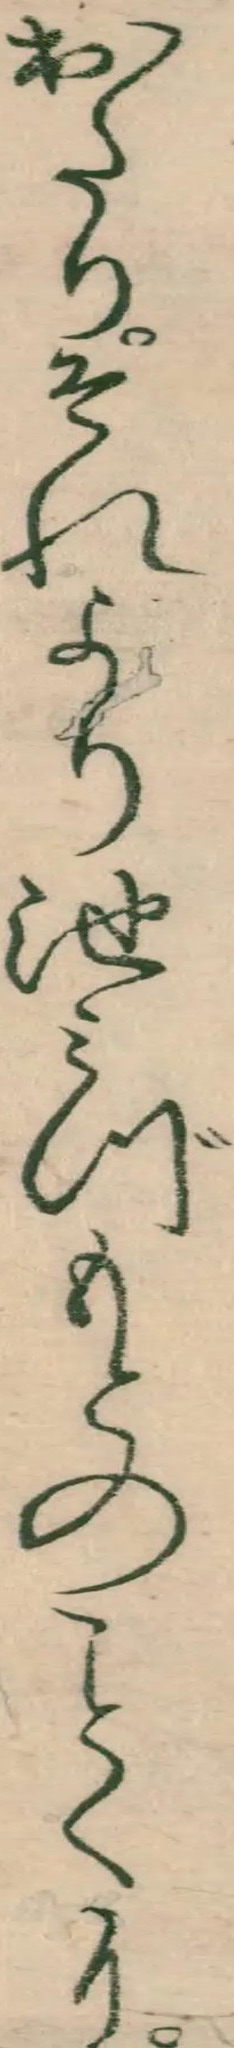出たり。それより池みづもとのことくに。
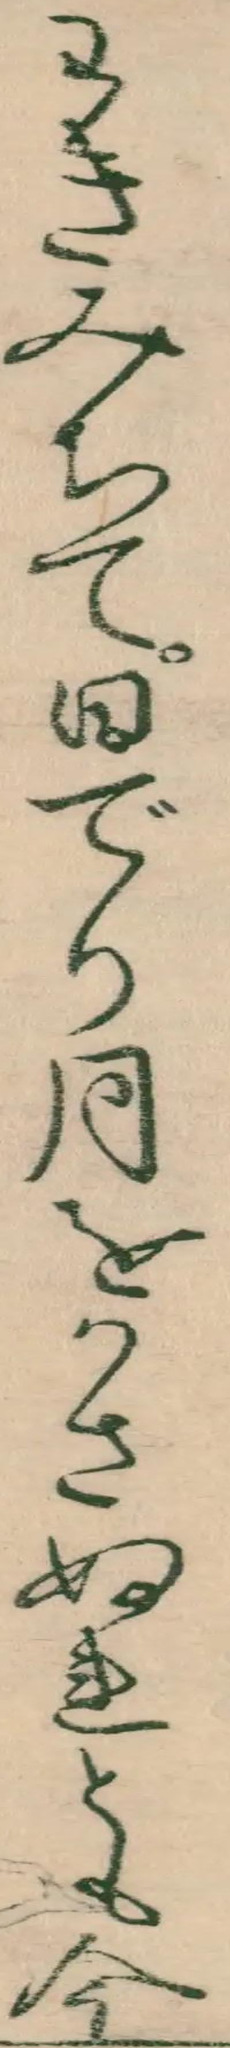わきみちて。日でり月をかさぬれとも今
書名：弘法大師御本地 3巻. [2]
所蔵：国立国会図書館 National Diet Library, JAPAN
